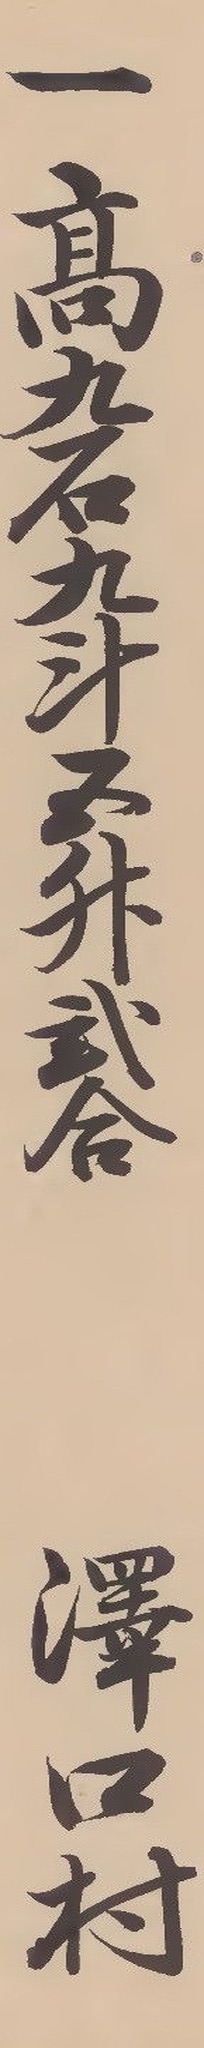一高九石九斗五升弐合沢口村
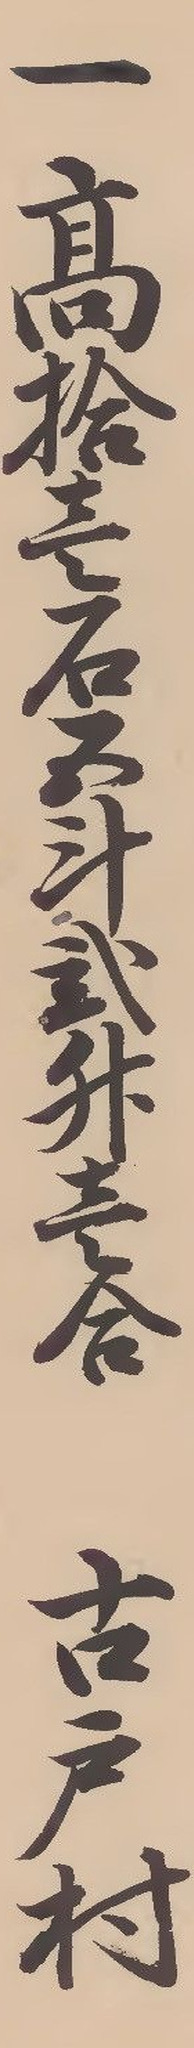一高拾壱石五斗弐升壱合古戸村

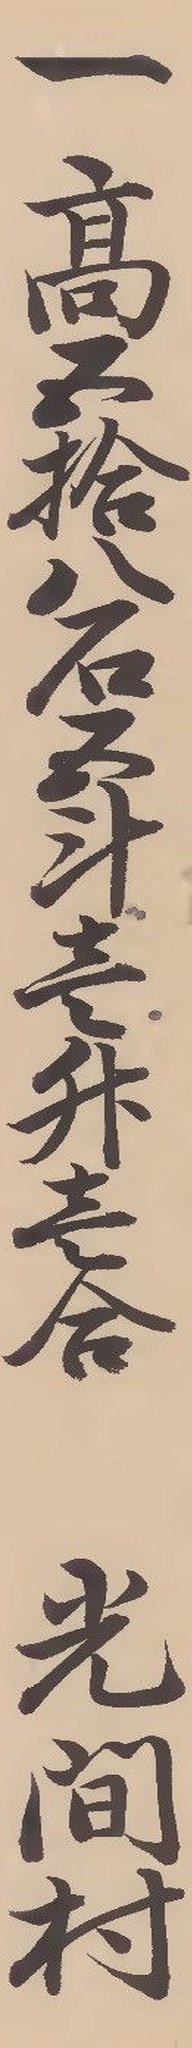一高五拾八石五斗壱升壱合光間村
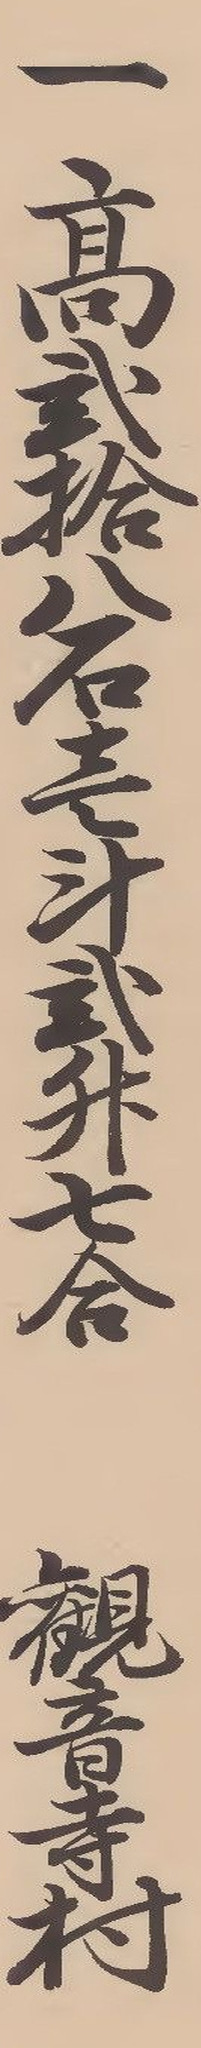一高弐拾八石壱斗弐升七合観音寺村
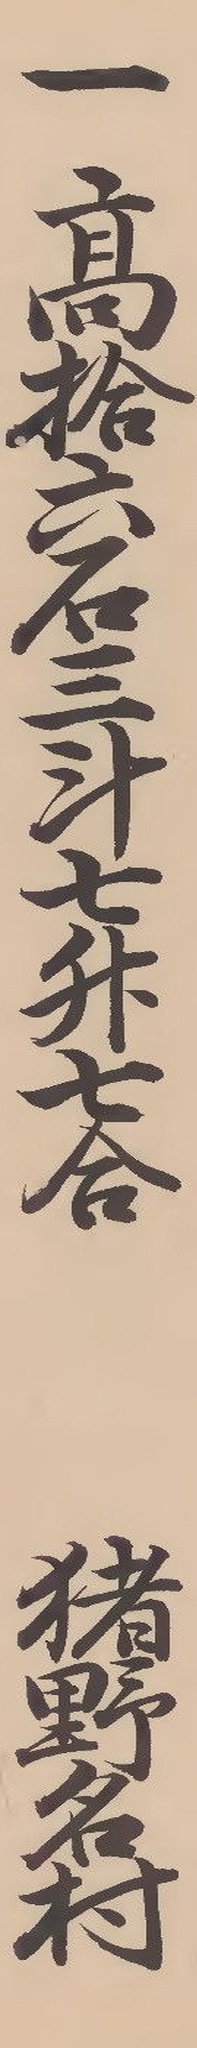一高拾六石三斗七升七合猪野名村
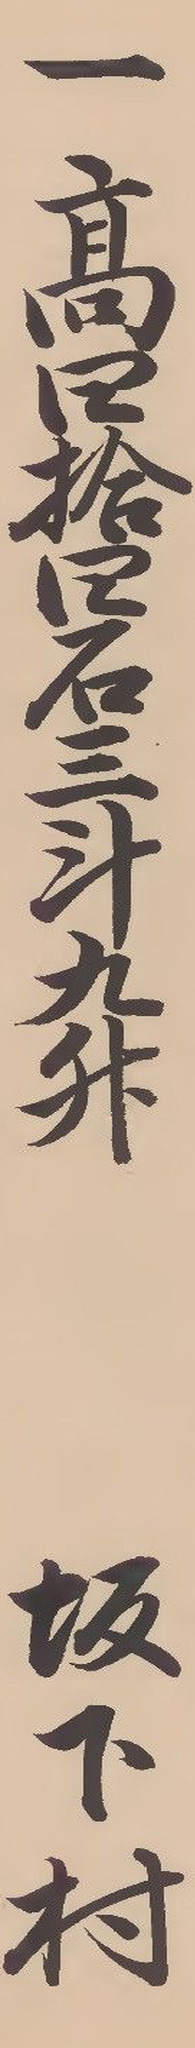一高四拾四石三斗九升坂下村
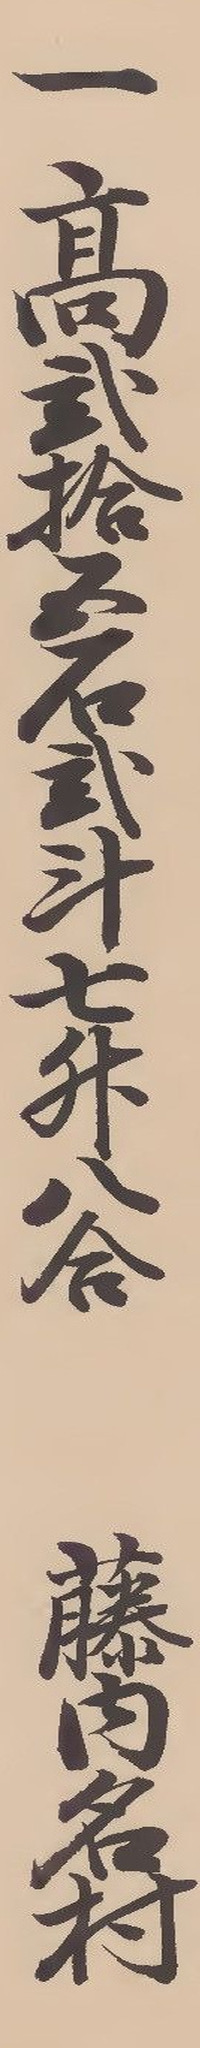一高弐拾五石弐斗七升八合藤内名村
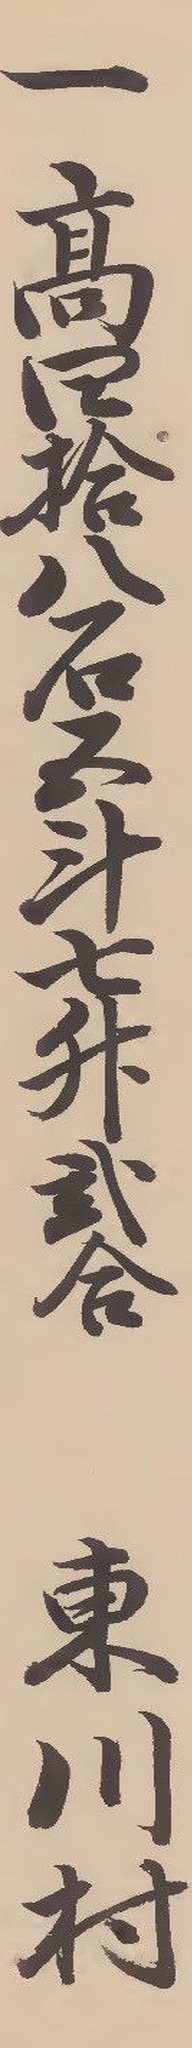一高四拾八石五斗七升弐合東川村
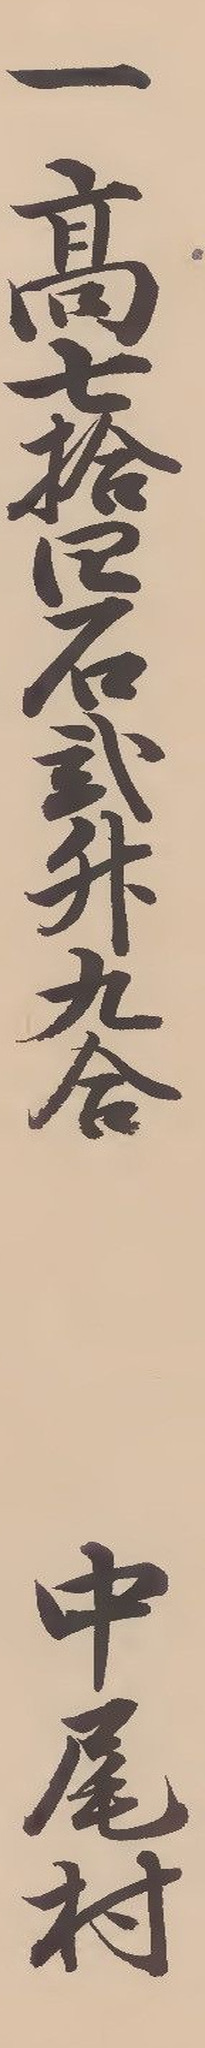一高七拾四石弐升九合中尾村
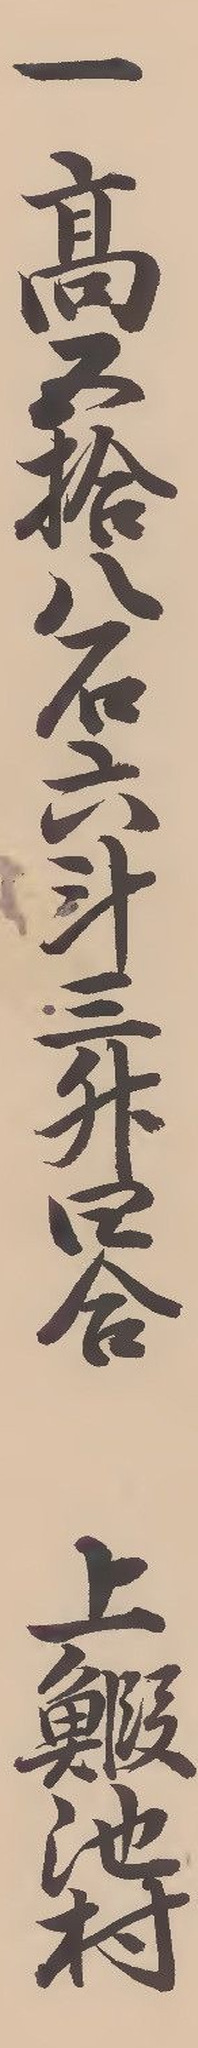一高五拾八石六斗三升四合上鰕池村

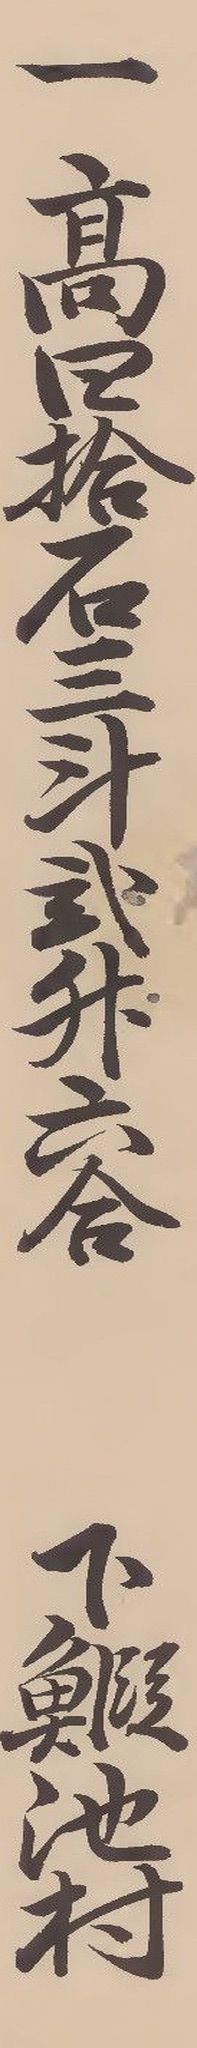一高四拾石三斗弐升六合下鰕池村
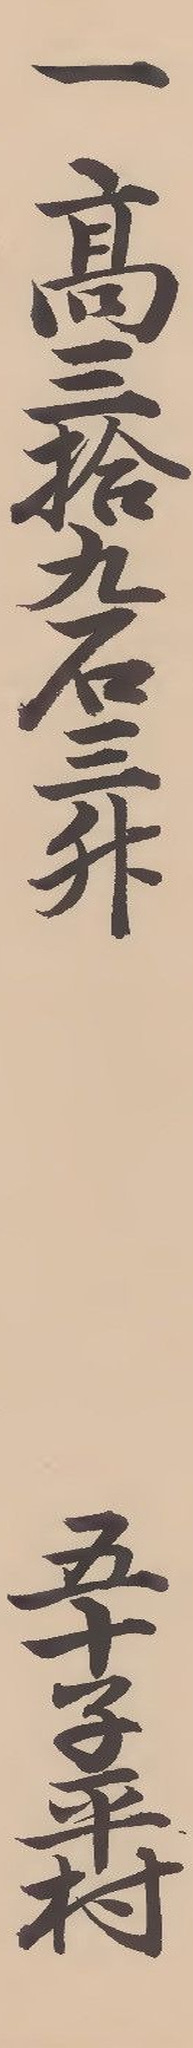一高三拾九石三升五十子平村
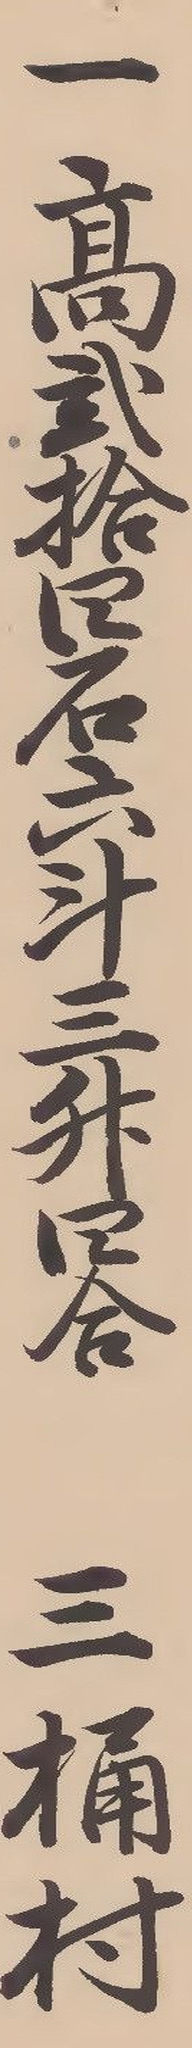一高弐拾四石六斗三升四合三桶村
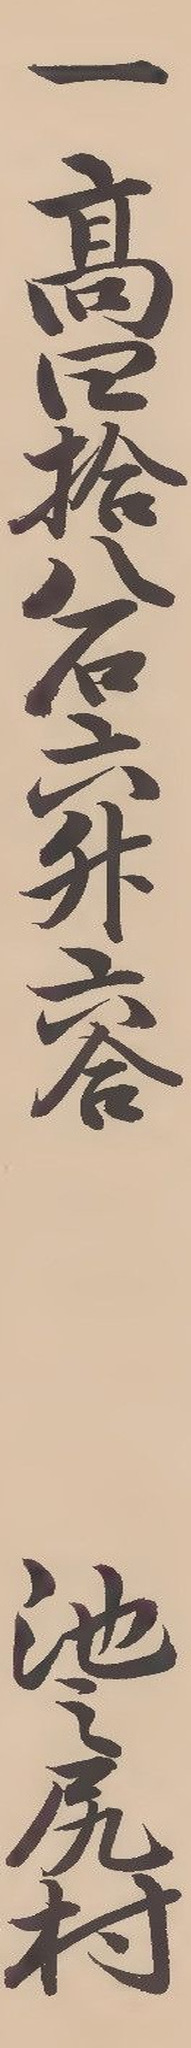一高四拾八石六升六合池之尻村
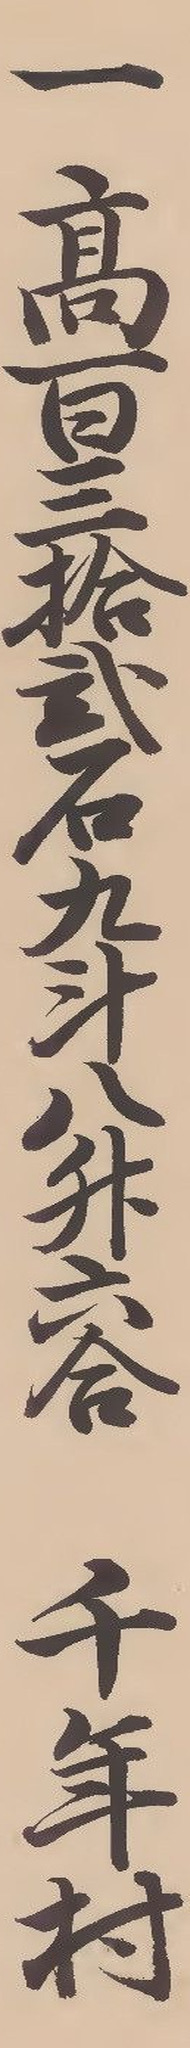一高百三拾弐石九斗八升六合千年村
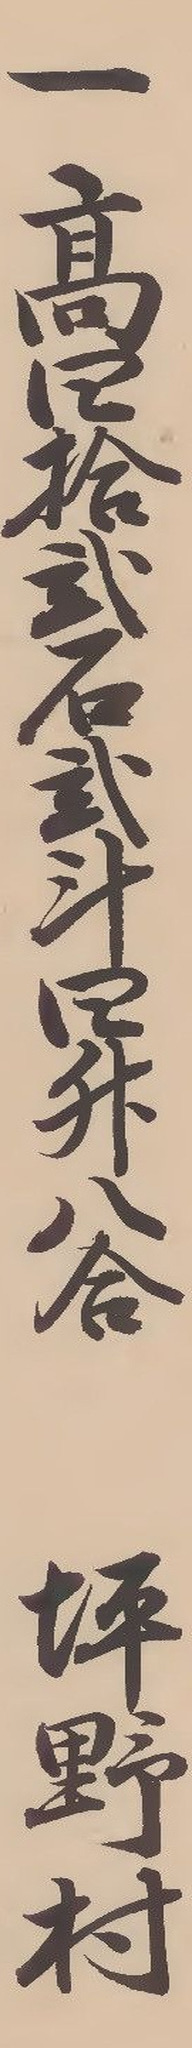一高四拾弐石弐斗四升八合坪野村
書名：越後国郷帳　上
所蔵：国立公文書館 National Archives of Japan
